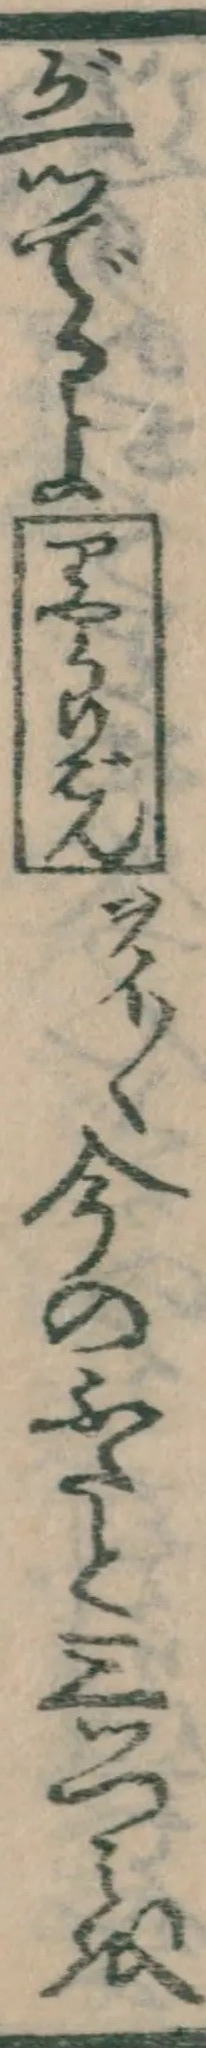が一ツでるよ〈りやうりばん〉ヲイ〳〵今のふたと三ツつみを
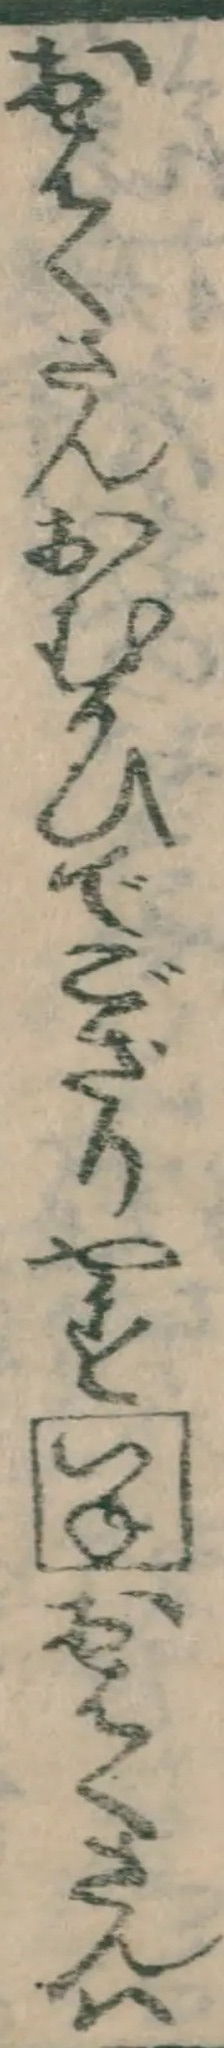おはくさんおむかひでござりやす〈いね〉おはくさんは

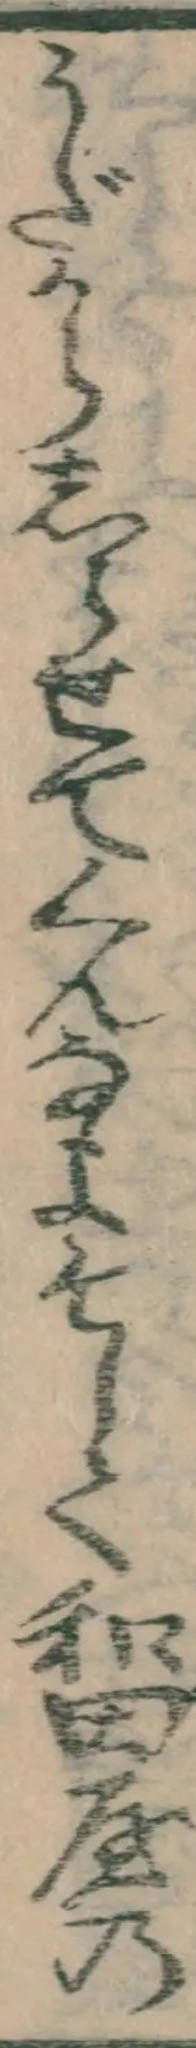うだからしらせてくんなよそして和田屋の
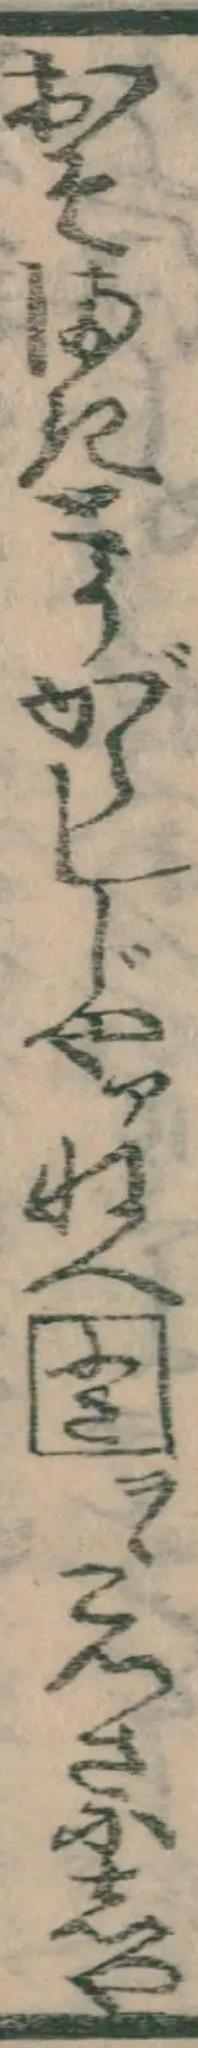おそまきとうがらしじやァねへ〈ふさ〉ヲヽこつさにしや
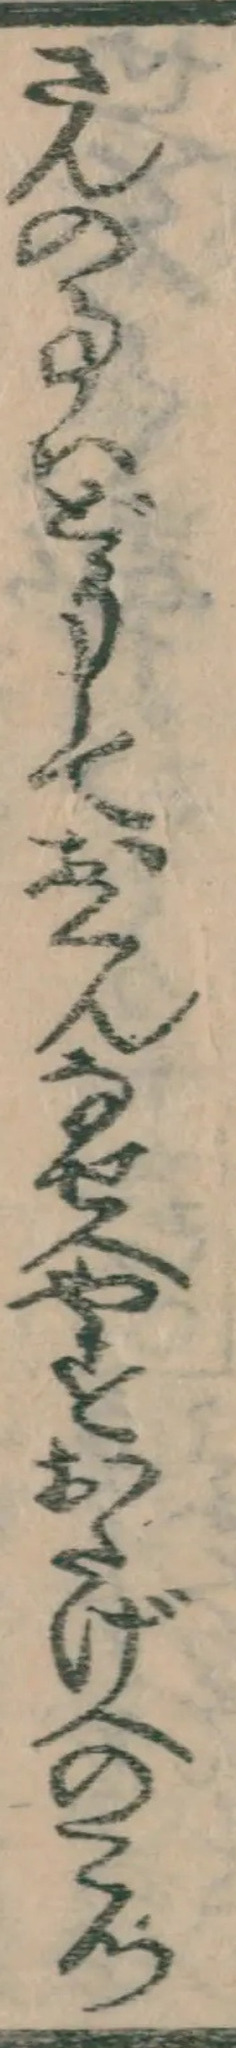さんの事はどうしておくんなせへやすおたげへのこつ
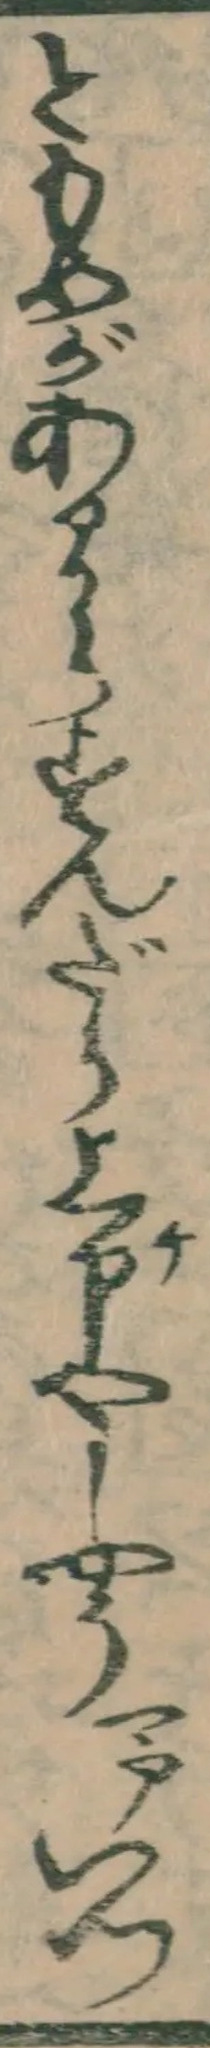ともめがあるからそんだら上け申やしやうマアいつ
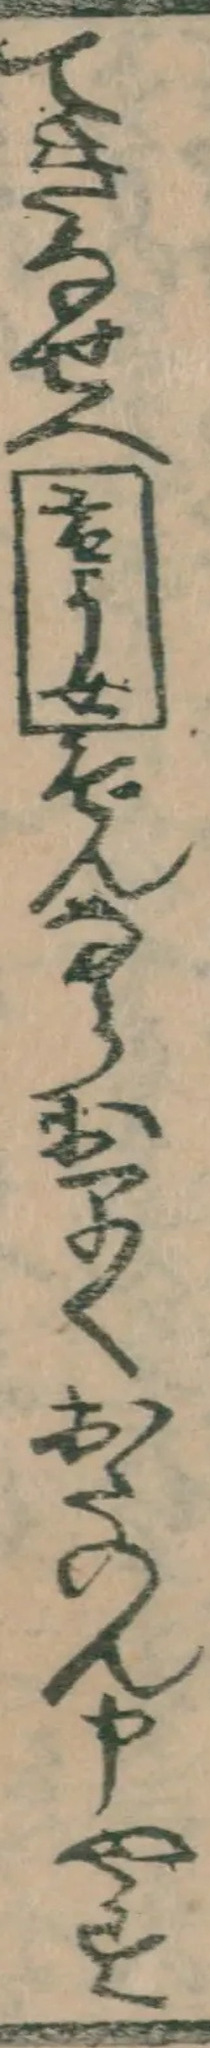てきなせへ〈雪よし女〉そんならお早くおたのん申やす
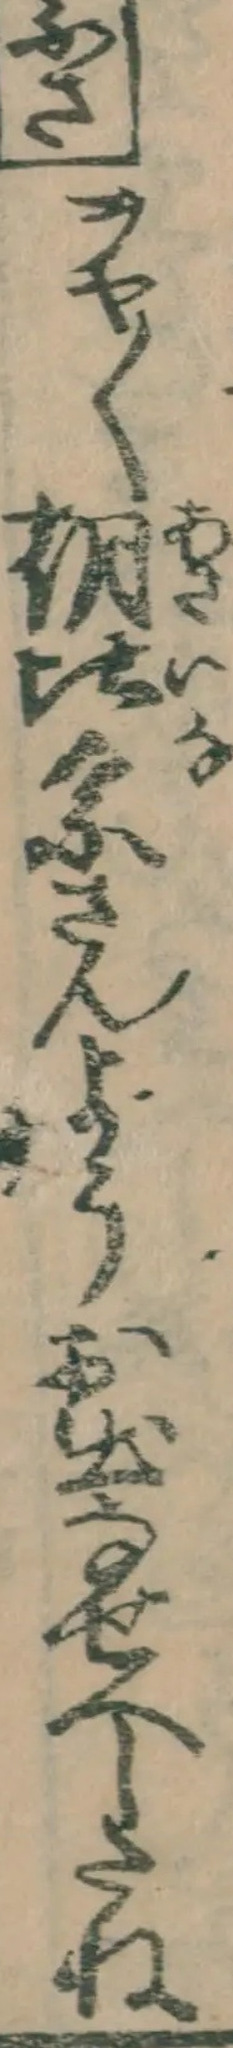〈ふさ〉ヲヤ〳〵朝比奈さんようお出なせへしたね

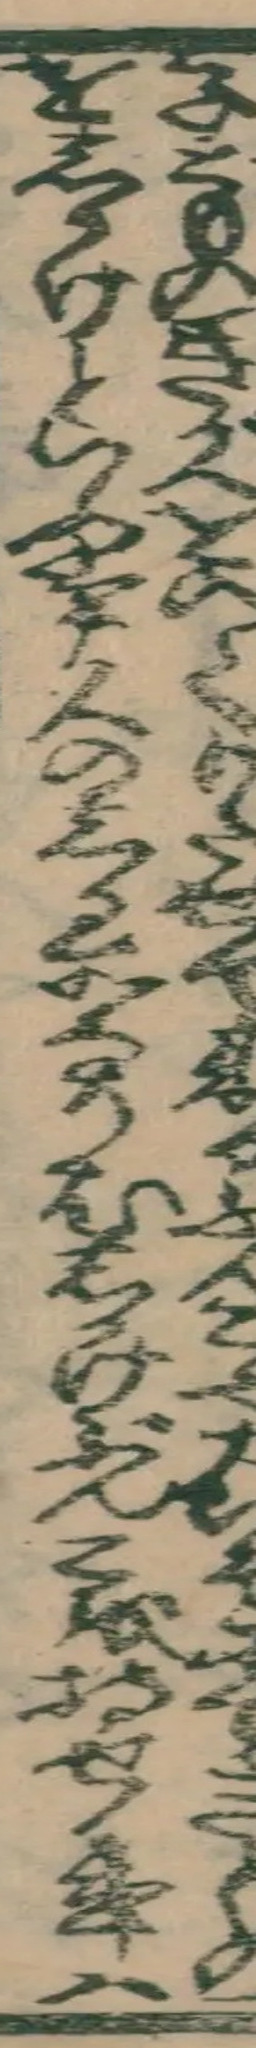をしかけといふ事人のしる所なり尤しかけぶんこを持せる事は
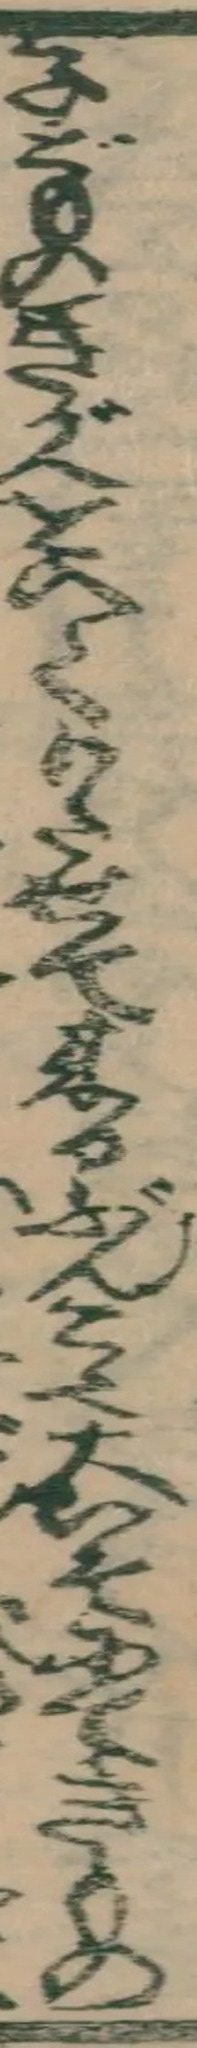子どものきがへを入てもたせて来るぶんこ也大いそにてきもの
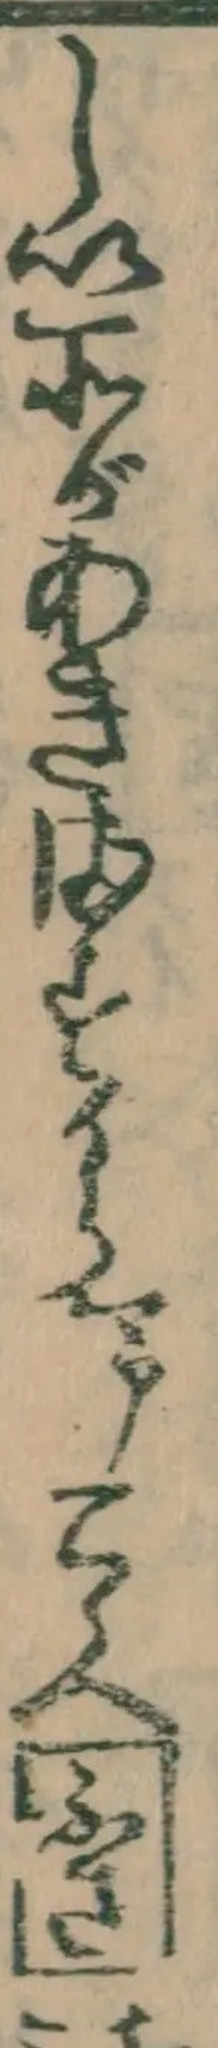しい所があきますからマアこゝへ〈ふさ〉
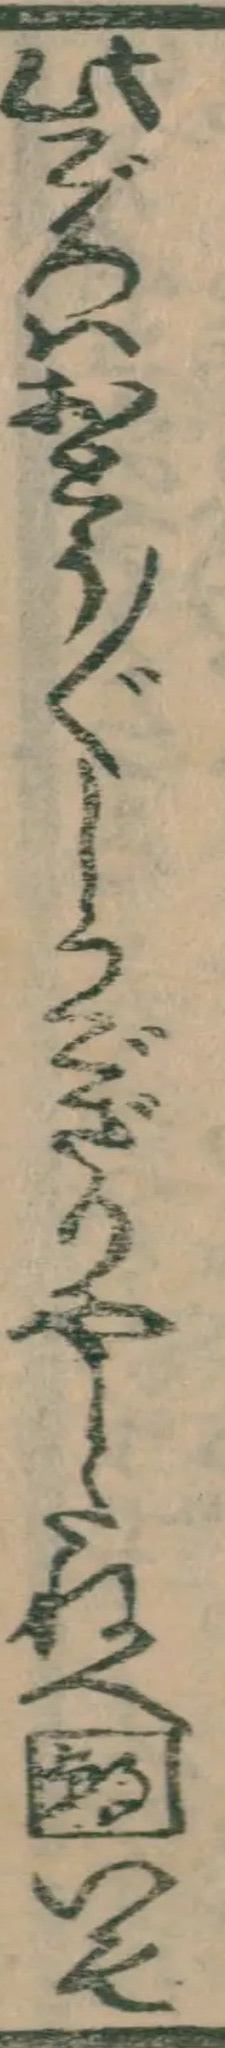此ごろはおとう〴〵しうござりやしたねへ〈朝〉いそ
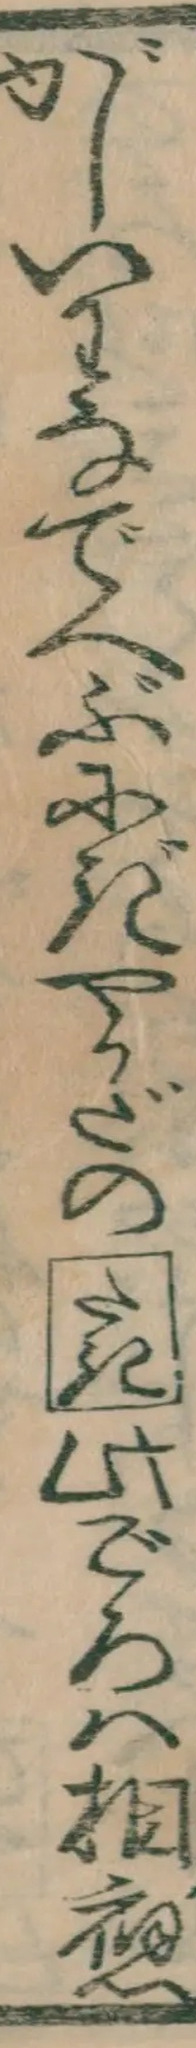がしいわなでへぶにぎやかだの〈さき〉此ごろは相応
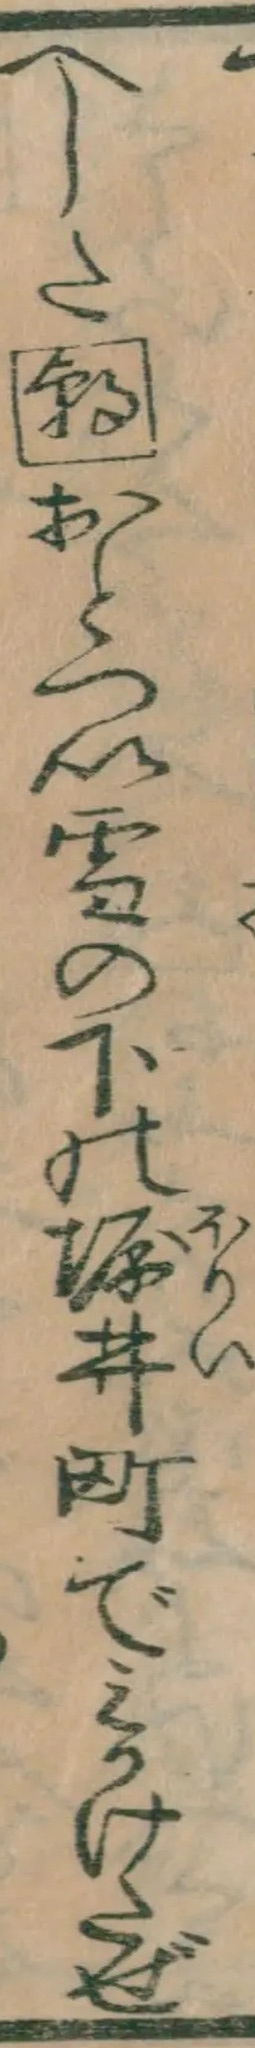へした〈朝〉おとつい雪の下の堀井町でみかけたぜ
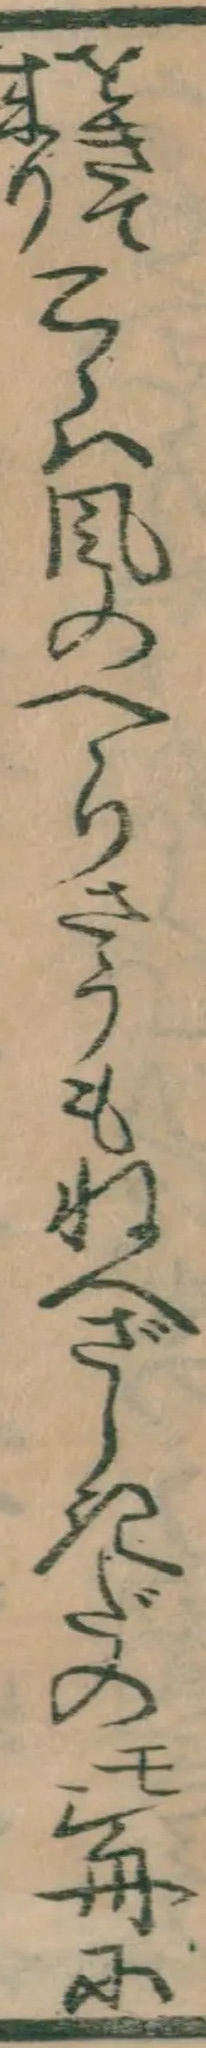をきて来りこゝは風のへゝりさうもねへざしきだのモシ舟に
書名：教訓読本：大礒風俗仕懸文庫
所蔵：国立国会図書館 National Diet Library, JAPAN
